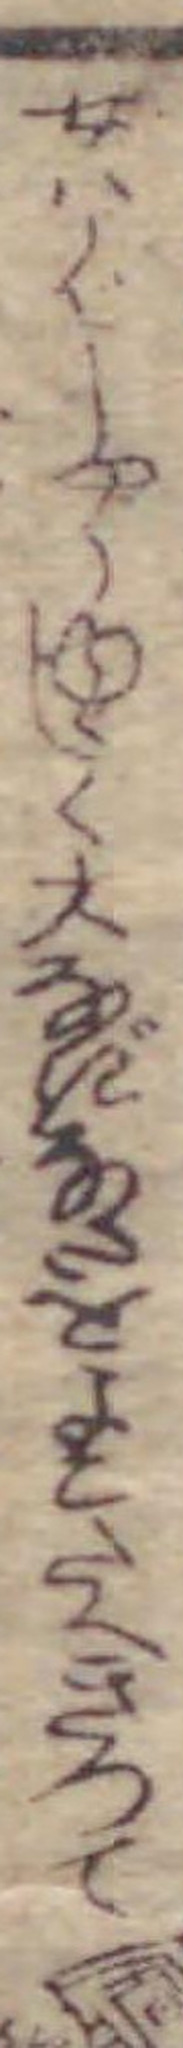女はしやうゆくしく大なぎなたをよこたへきつて
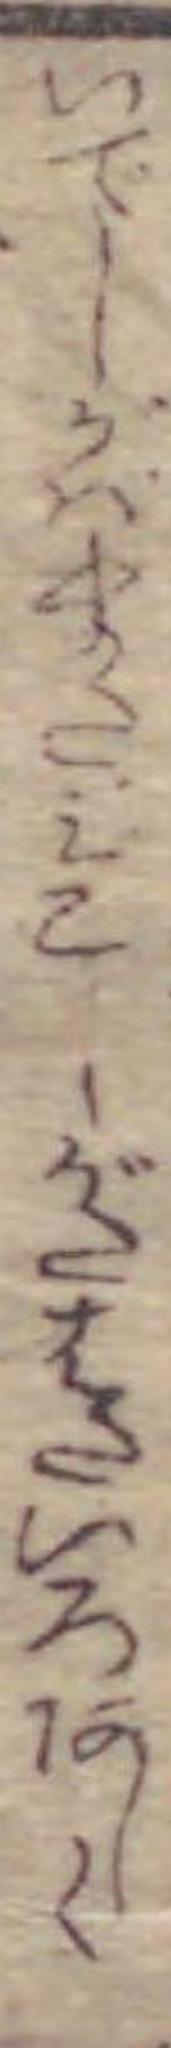いでしかばまたみこしがたはたいろあしく
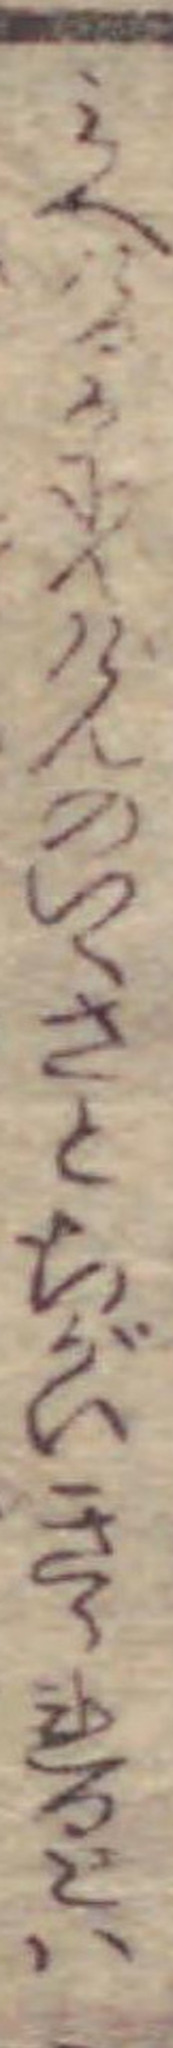みへけるにんげんのいくさとちがいきられるとは
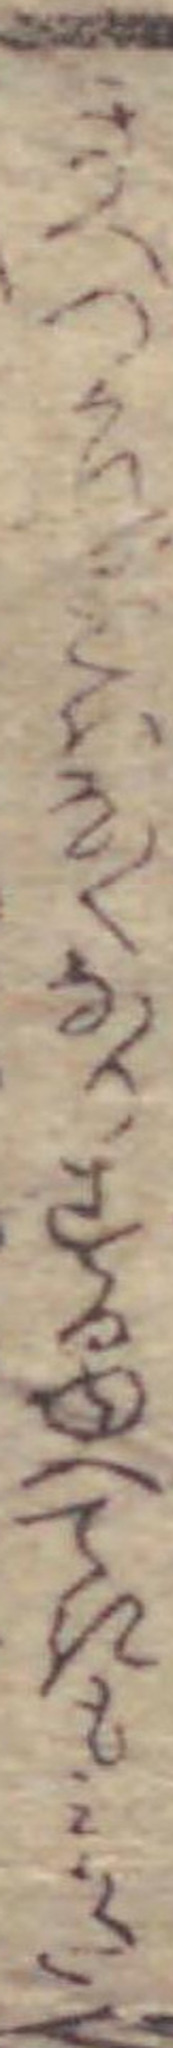きへつかれるとはなくなりするゆへてきもみかた
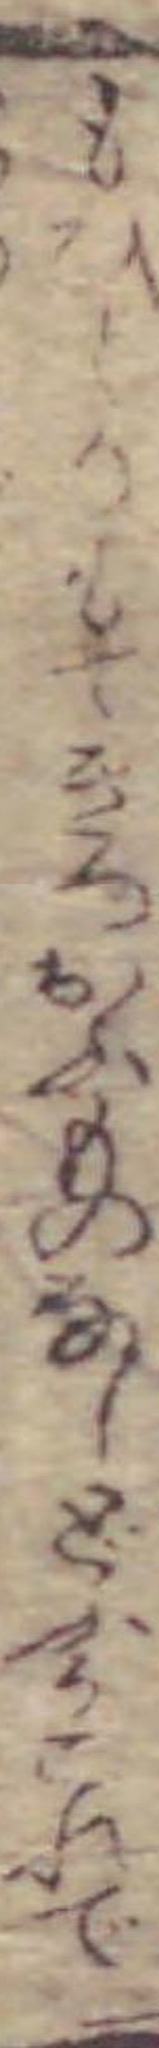もひとりもてきつおふものなしどふかこれで
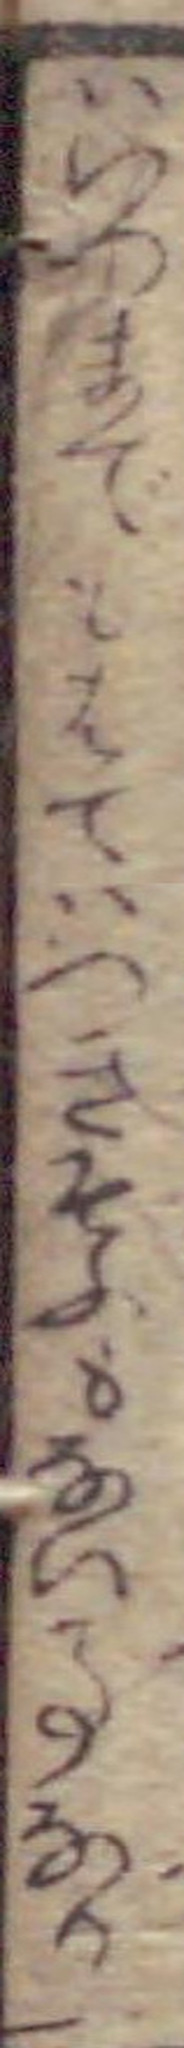はいつまでもはてはつきそふもない事なり
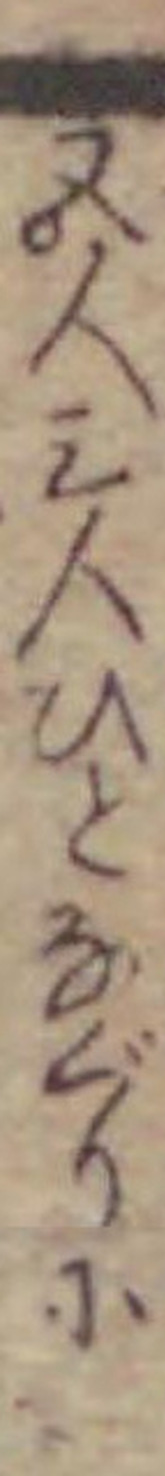五人三人ひとなぐりに
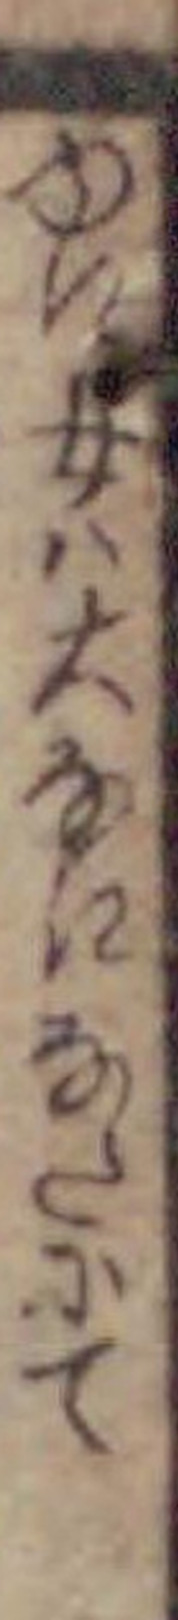ゆき女は大なきなたにて
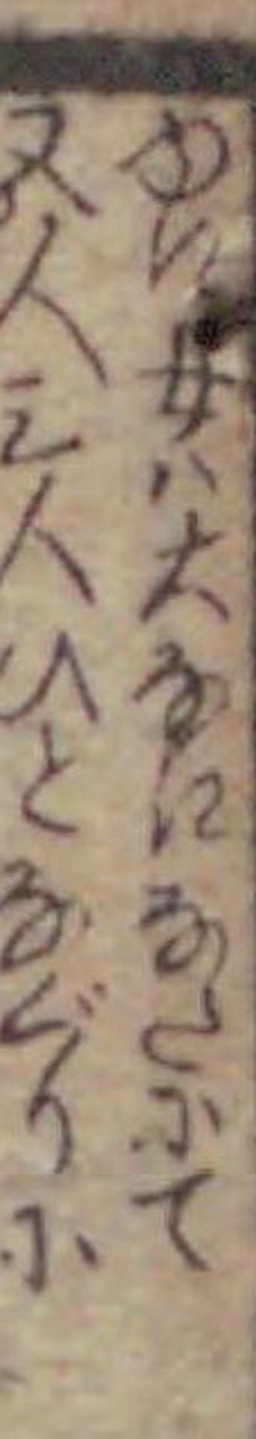五人三人ひとなぐりに
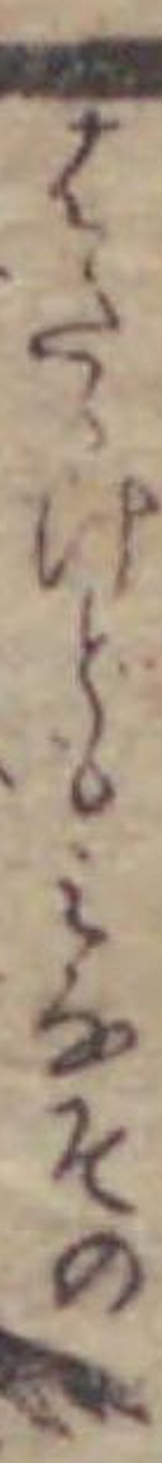はたらけどもみなその
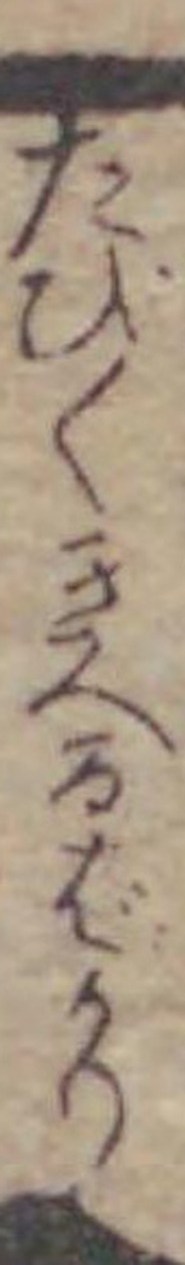たび〳〵きへるばかり
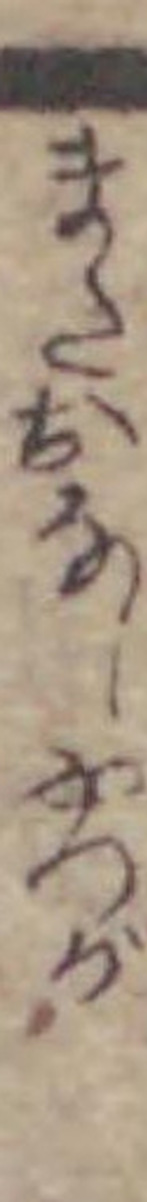またおなしやつが
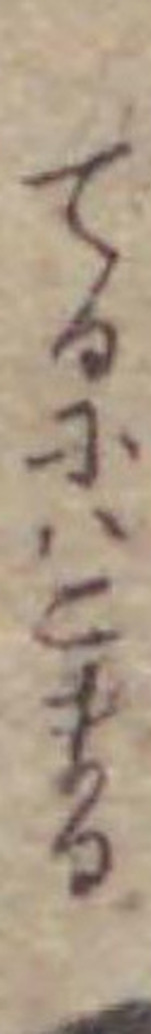てるにはこまる
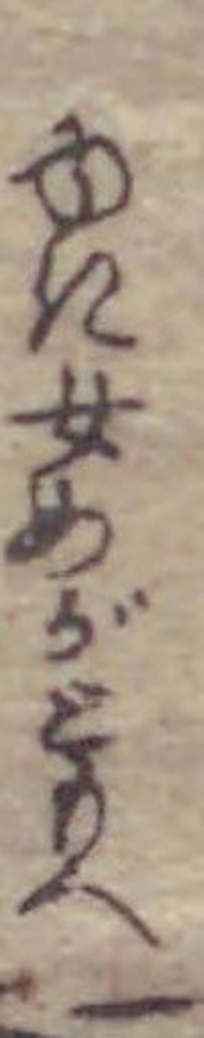ゆき女めがともへ
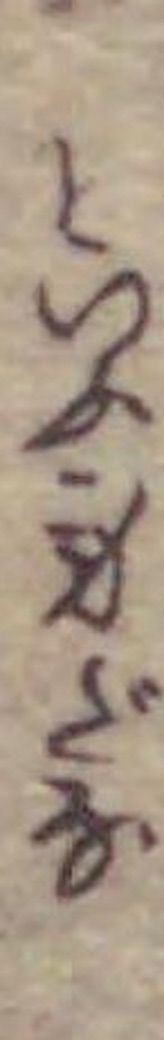といふ身だな
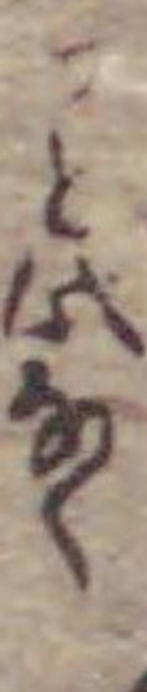と此なく
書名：化物仲間破 : 2巻
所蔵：国立国会図書館 National Diet Library, JAPAN
